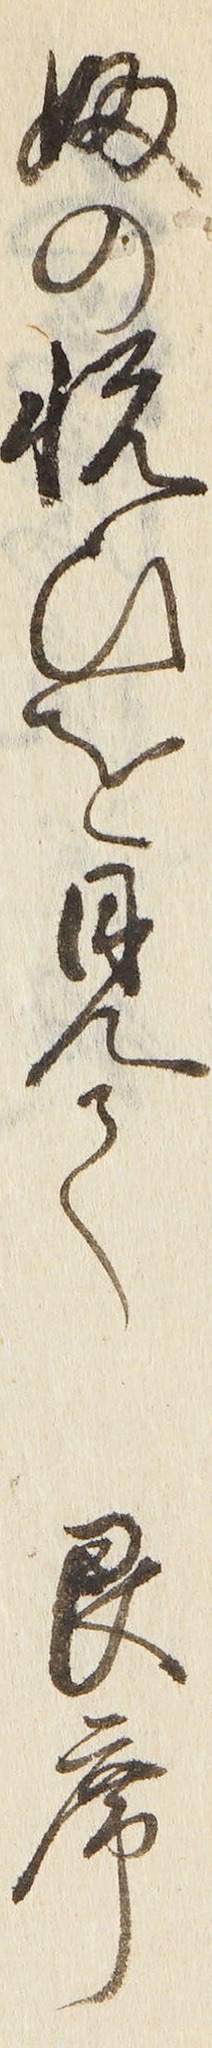婦の悦ひを見て艮席
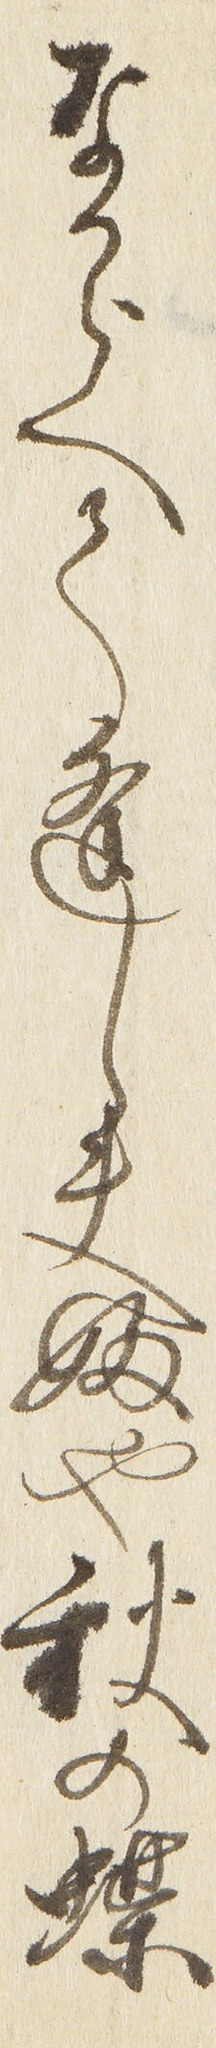なからへて逢し夫婦や秋の蝶

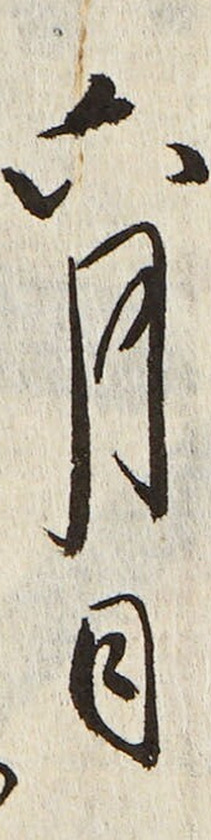六月日
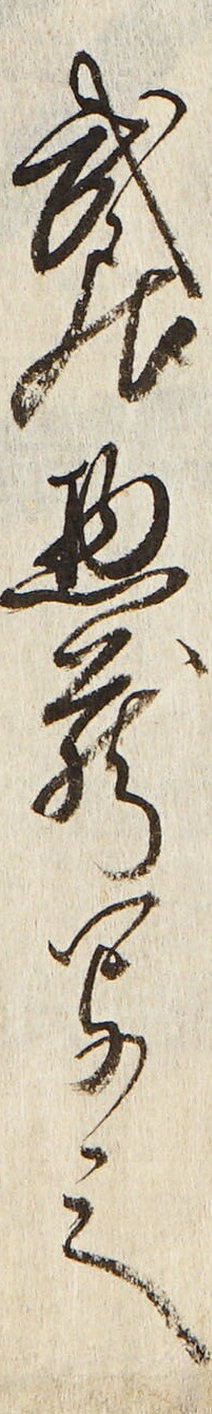武居惣蔵写之
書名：天保漂流記
